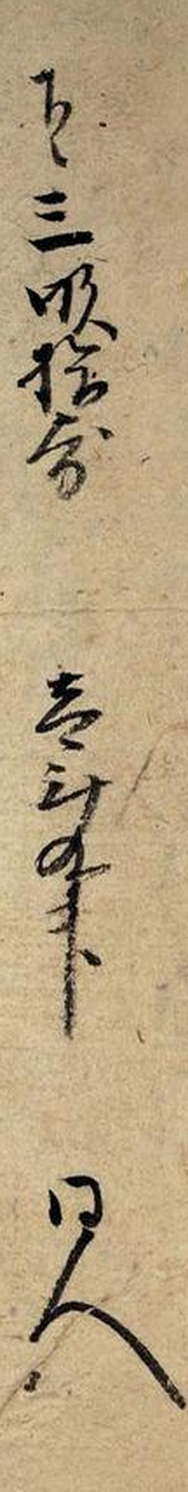下々三畝拾歩壱斗九升同人
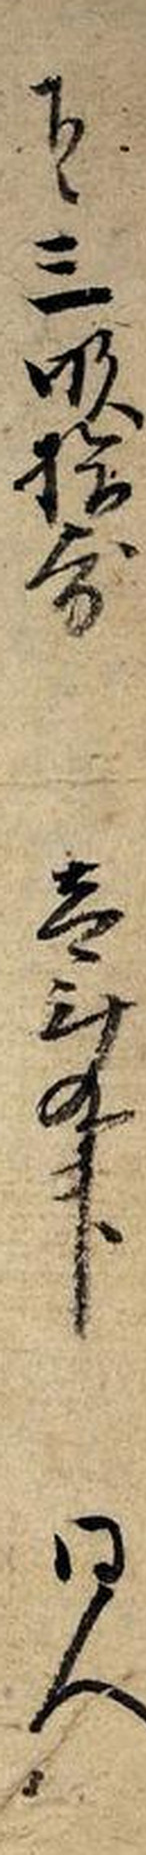下々三畝拾歩壱斗九升同人
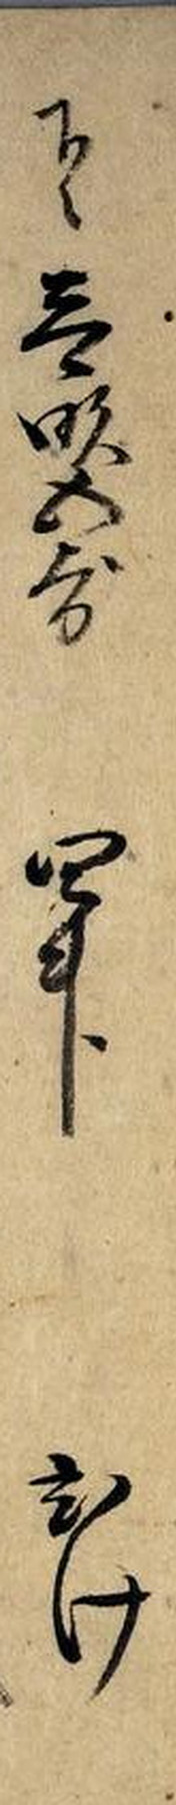下々壱畝五歩四升ひけ
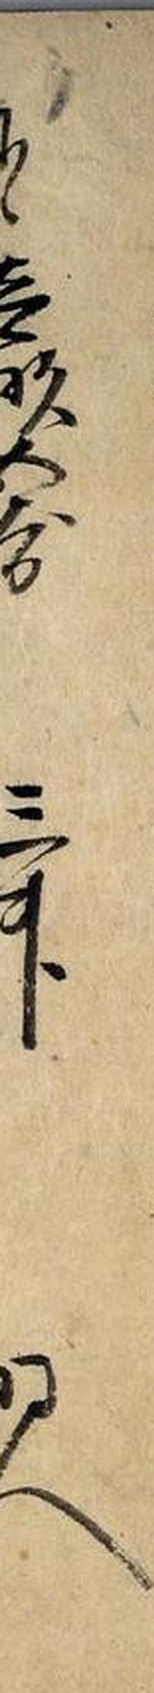下々壱畝五歩三升同人
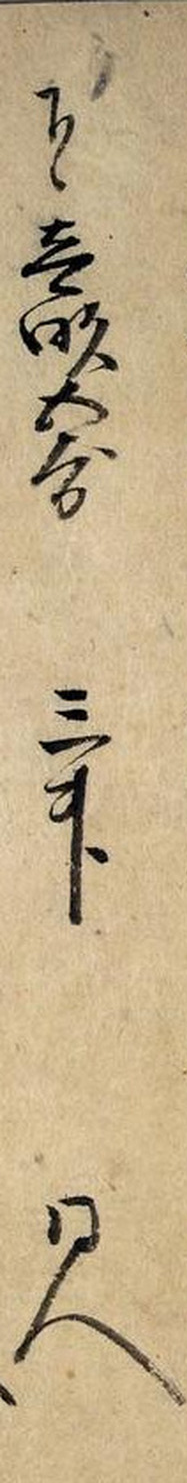下々壱畝五歩三升同人
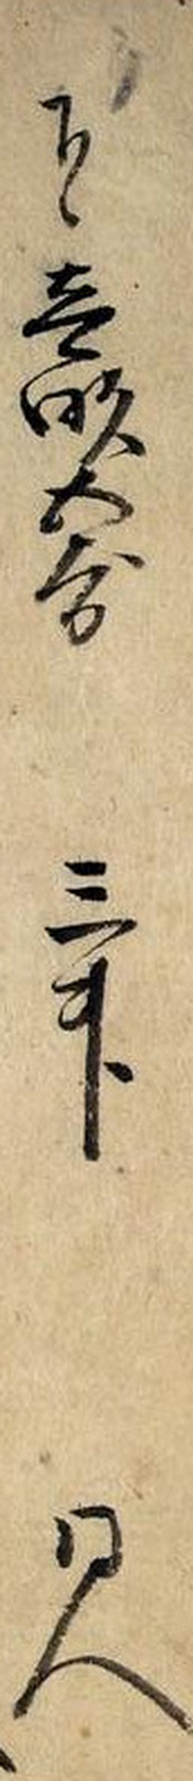下々壱畝五歩三升同人
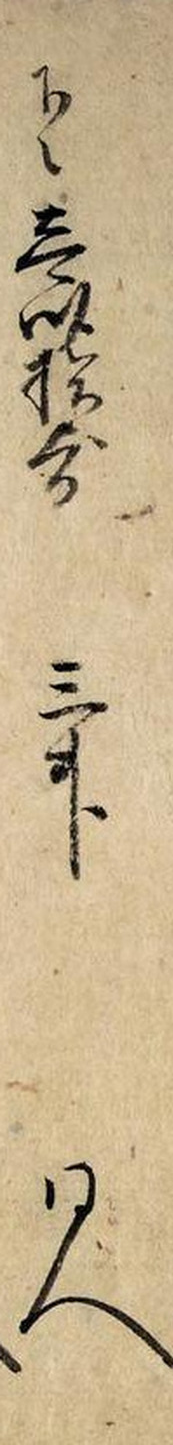下々壱畝拾歩三升同人
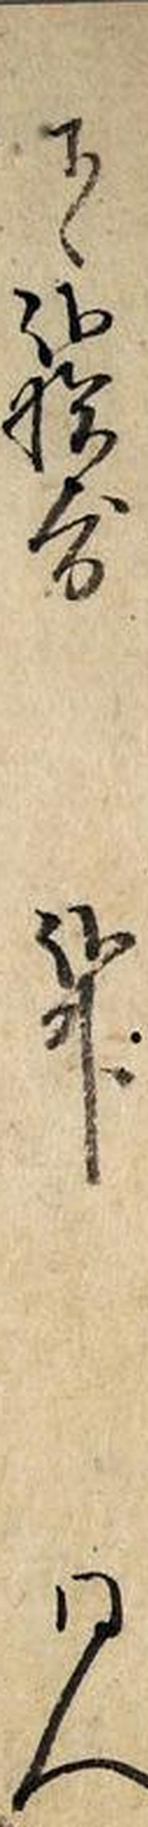下々弐拾歩弐升同人
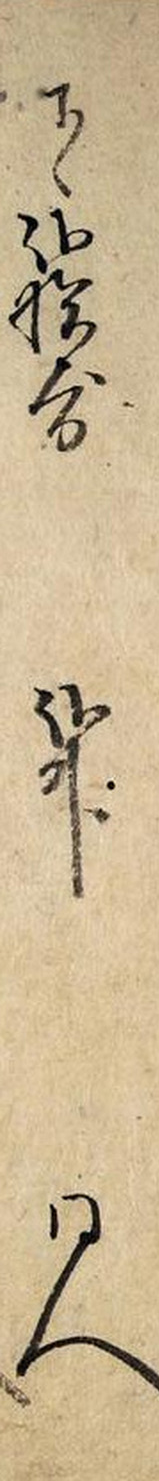下々弐拾歩弐升同人
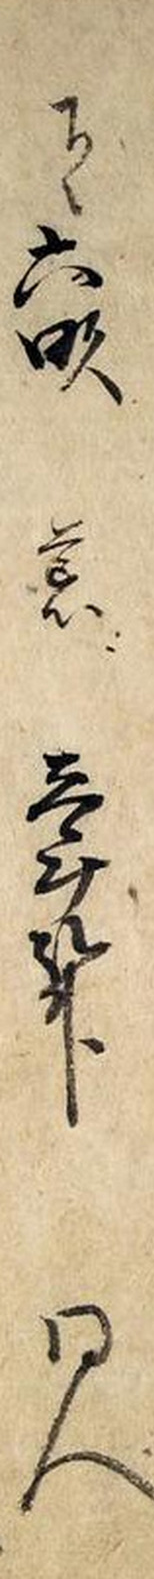下々六畝荒壱斗弐升同人
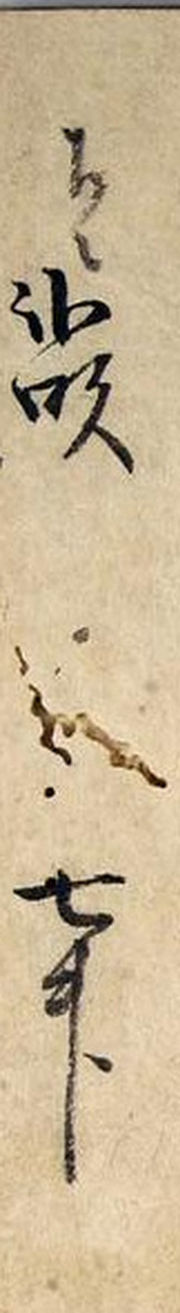下々弐畝七升同
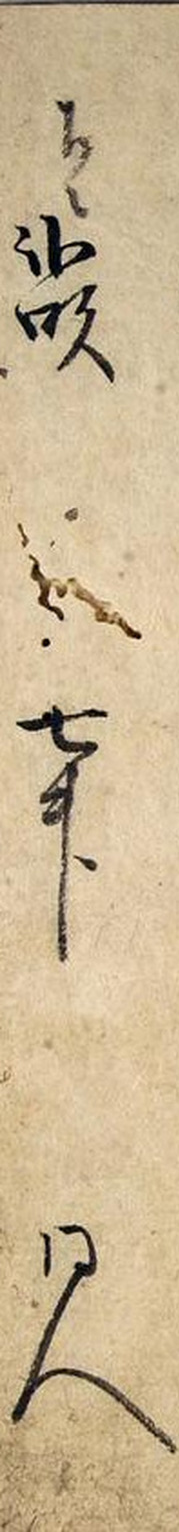下々弐畝七升同

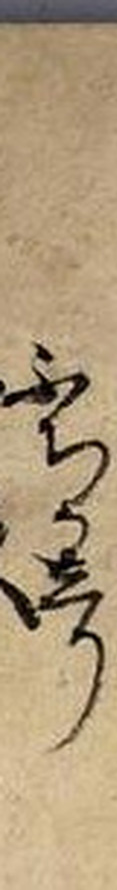ふちかしり
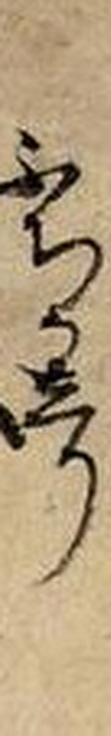ふちかしり
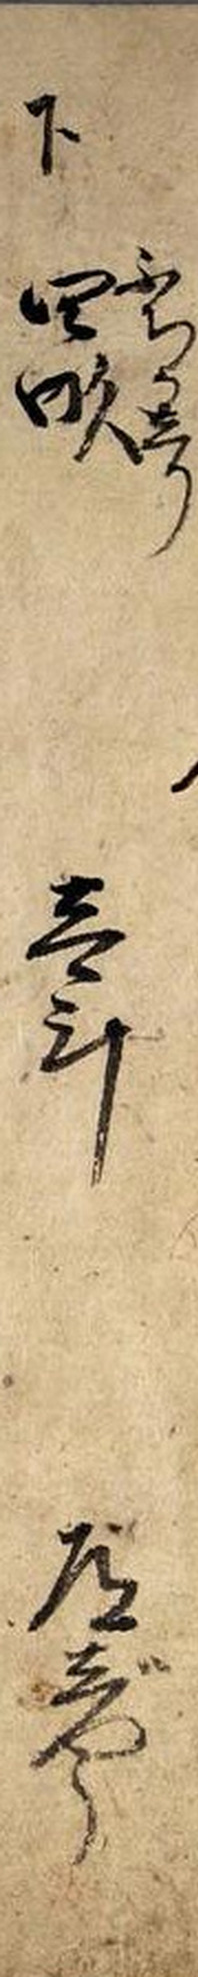下四畝壱斗道じやう
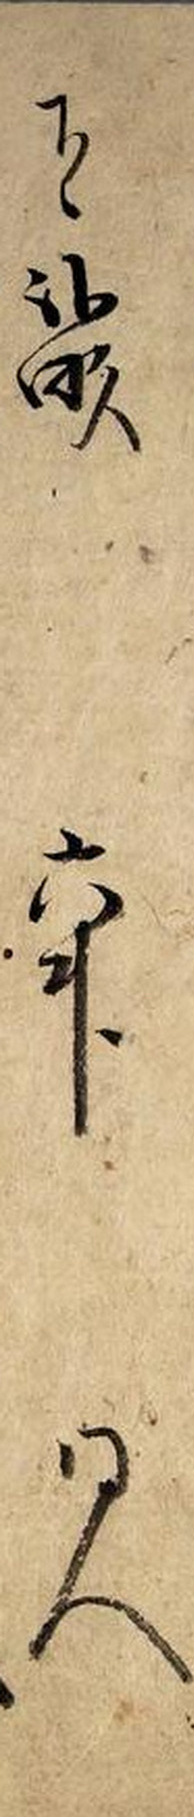下々弐畝六升同人
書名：若州三方郡之内世久見浦御検地帳（世久見浦検地帳写）
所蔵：福井県文書館 Fukui Prefectural Archives
